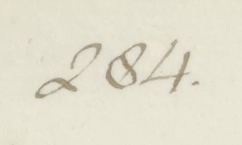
284.
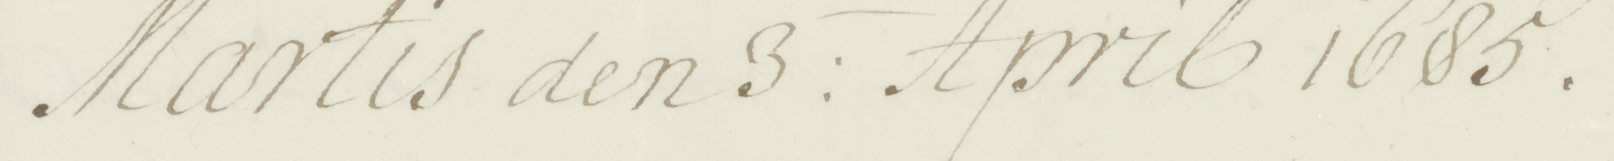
Martis den 3. April 1685.
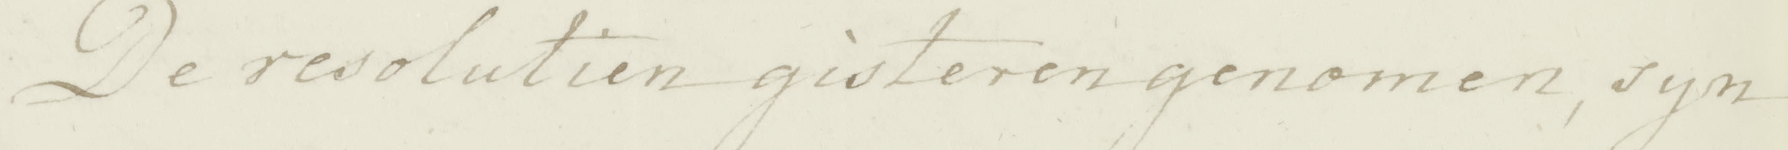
De resolutien gisteren genomen, sijn
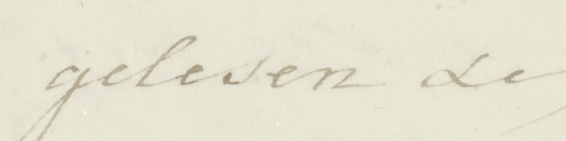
gelesen de
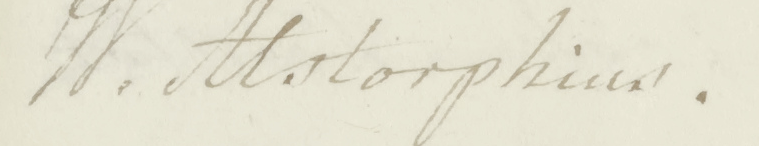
W. Alstorphius.
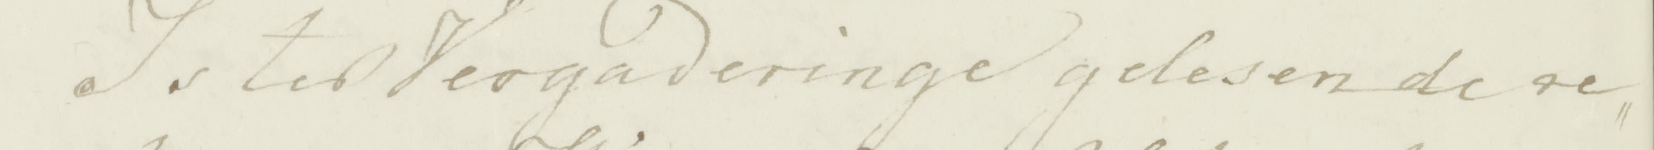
Is ter Vergaderinge gelesen de re„
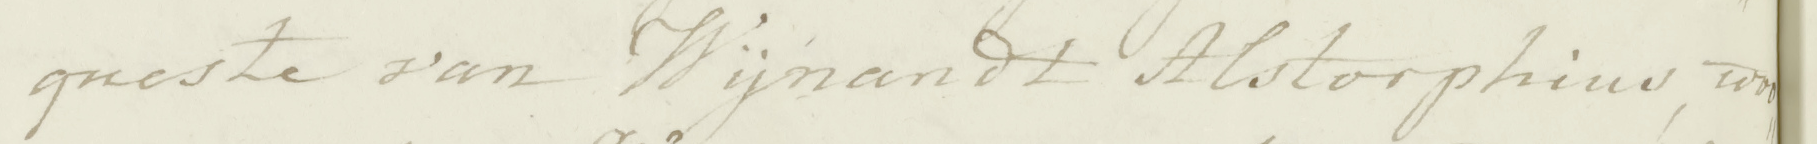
queste van Wijnandt Alstorphius woo„
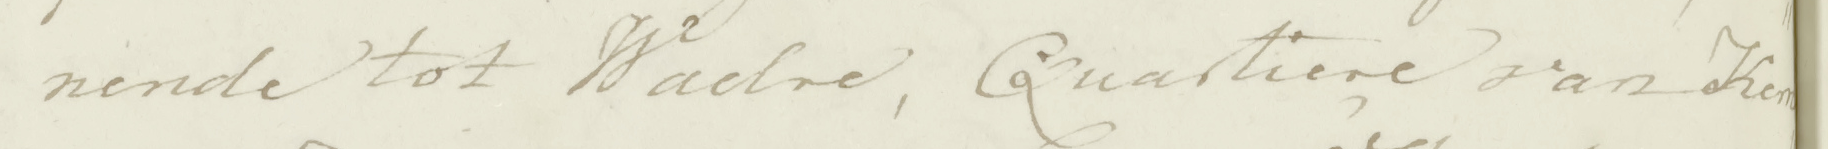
nende tot Waelre, Quartiere van Kem
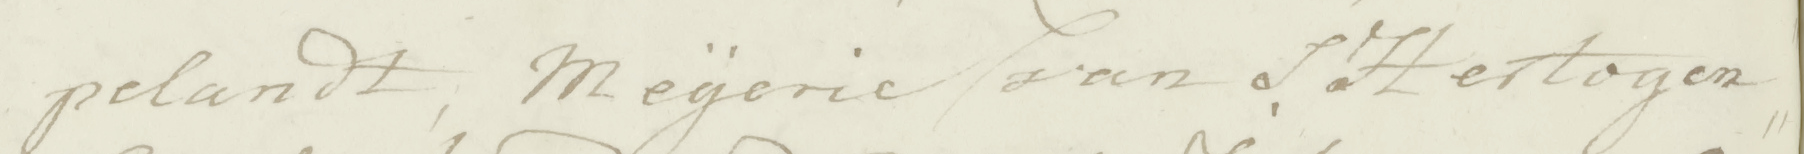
pelandt, Meijerie van S'Hertogen„
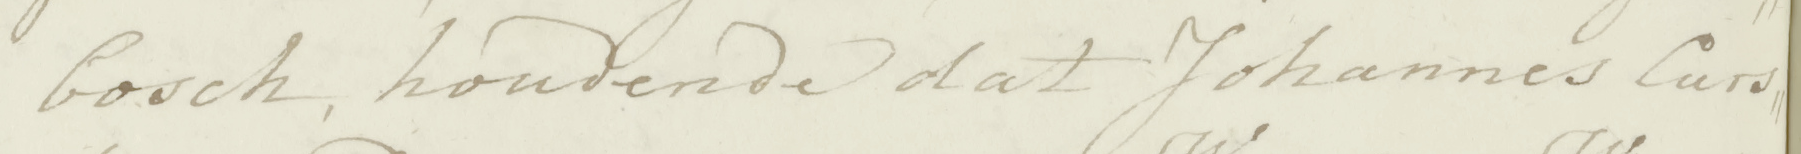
bosch, houdende dat Johannes Curs„
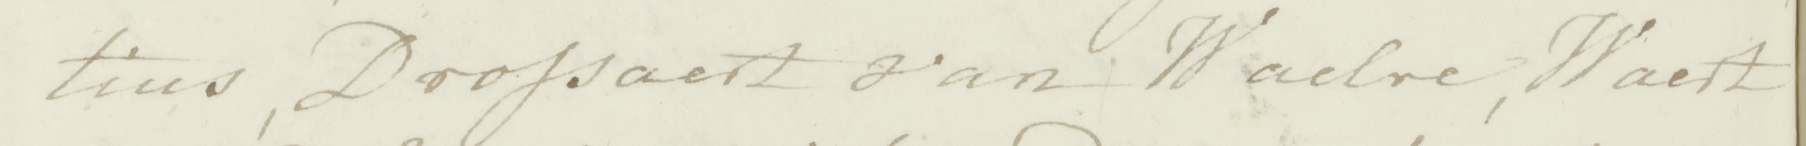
tius, Drossaert van Waelre, Waert
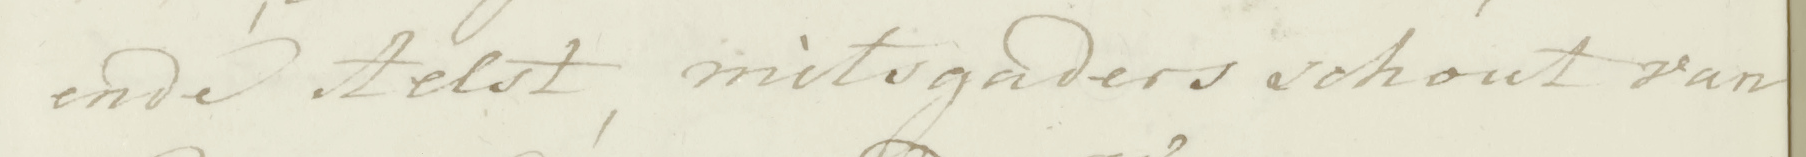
ende Aelst mitsgaders schout van
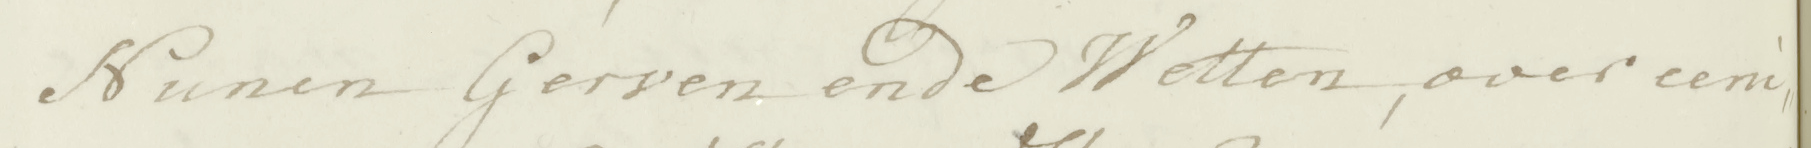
Nunen Gerven ende Wetten, over eeni„
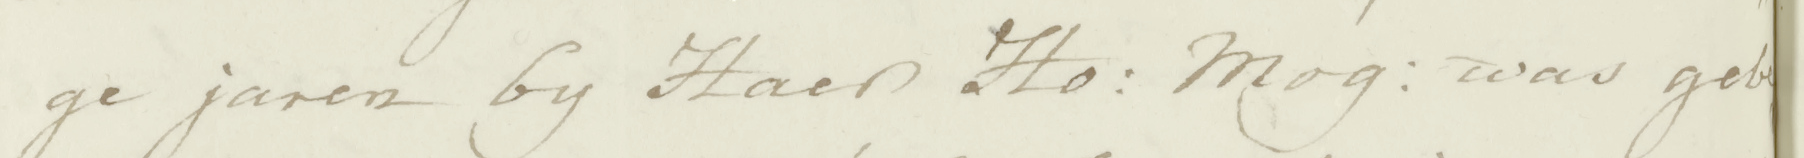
ge jaren bij Haer Ho: Mog: was gebe„
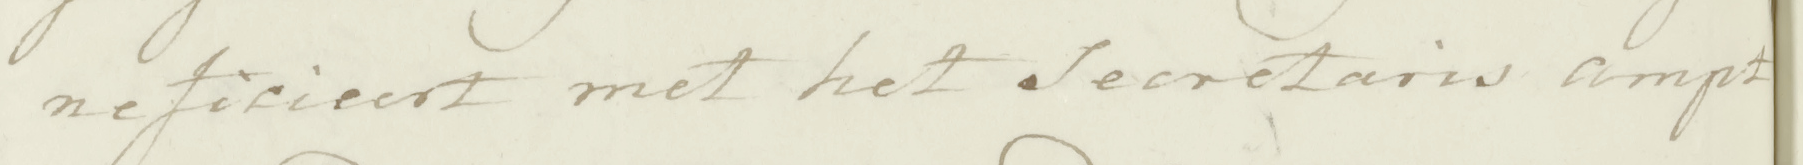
neficieert met het Secretaris Ampt
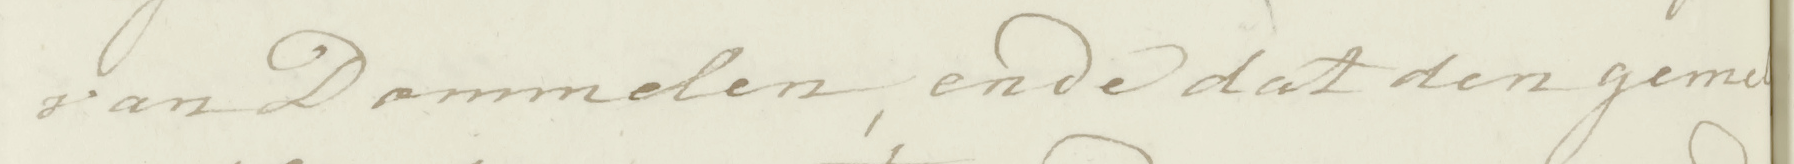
van Dommelen, ende dat den gemel
